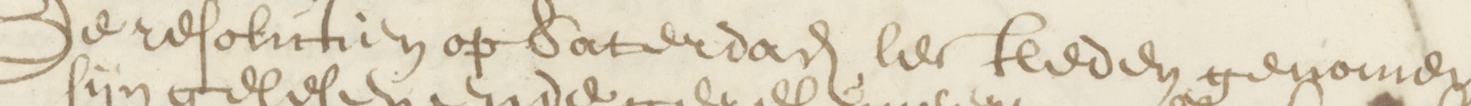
De resolutien op Saterdach lestleden genomen,
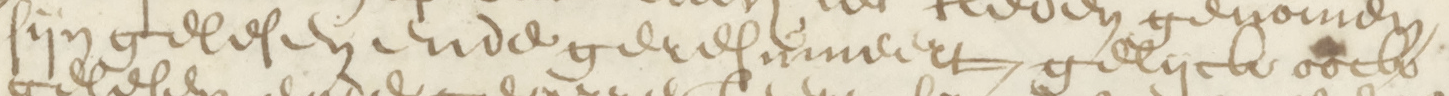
sijn gelesen ende geresumeert, gelijck oock
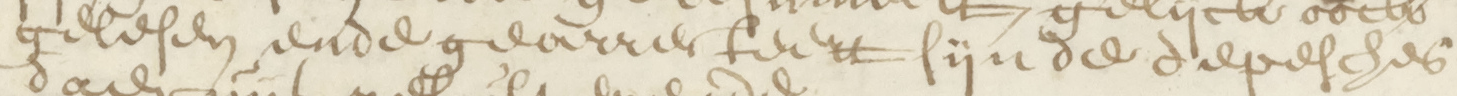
gelesen ende gearresteert sijn de depesches
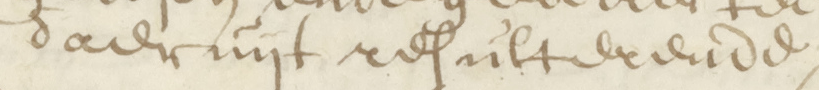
daeruijt resulterende.
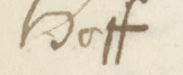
Hoff
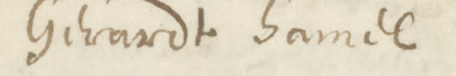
Gerardt Hamel
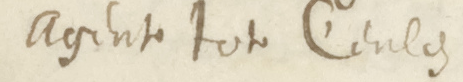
Agent tot Ceulen
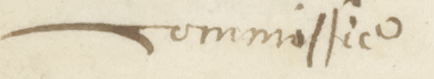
commissie
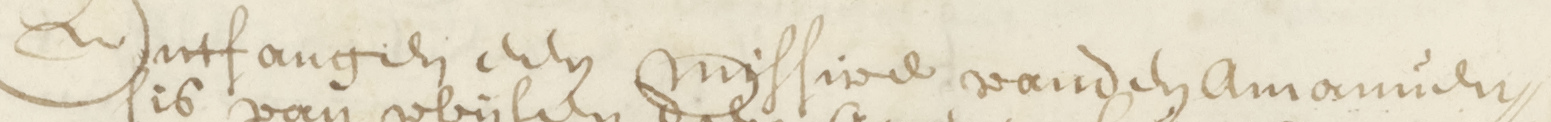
Ontfangen een missive vanden Amanuen„
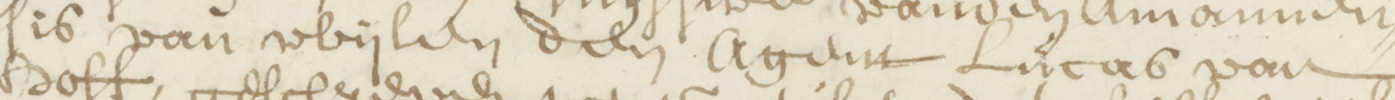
sis van wijlen den Agent Lucas van
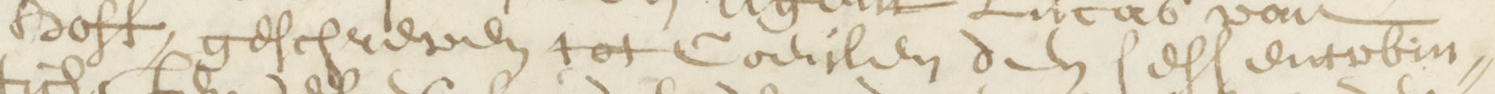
Hoff, geschreven tot Coeulen den sessentwin„
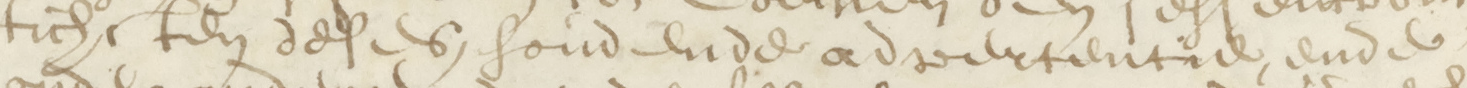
tichsten deses, houdende advertentie ende
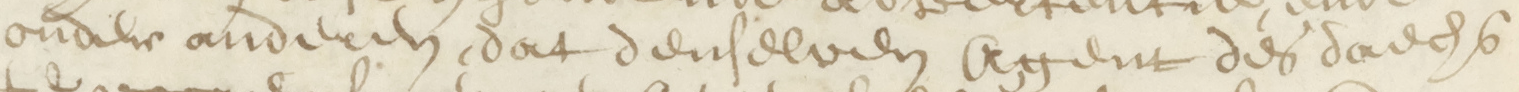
onder anderen, dat denselven Agent des daechs
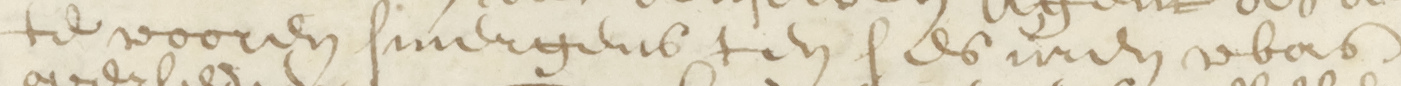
te vooren smergens ten ses uren was
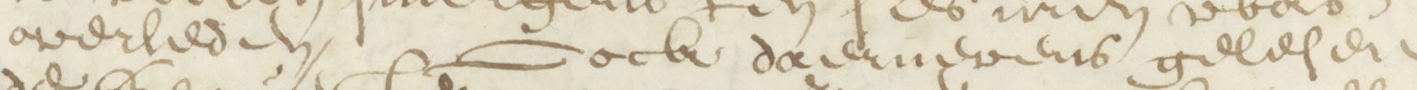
overleden. Oock daernevens gelesen
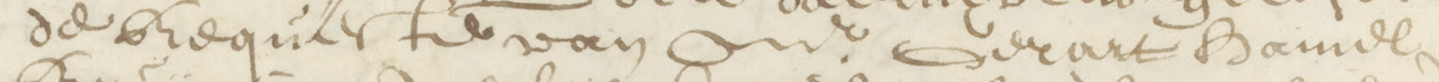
de Requeste van Mr. Gerart Hamel
